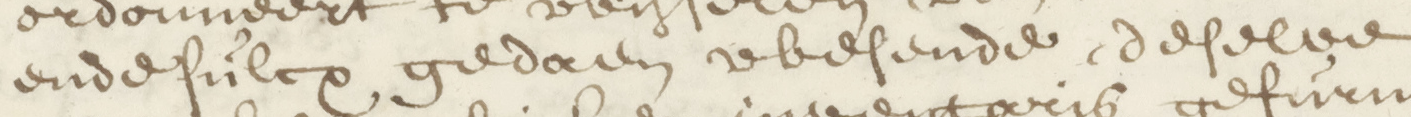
ende sulcx gedaen wesende, deselve
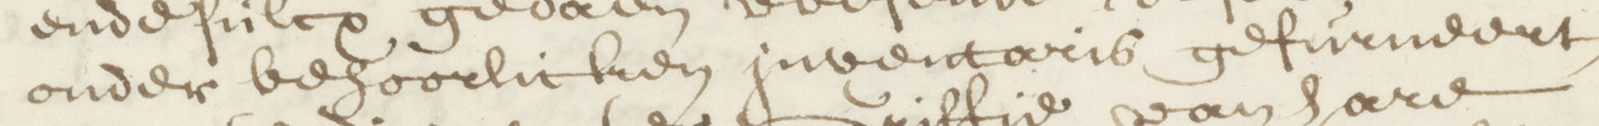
onder behoorlicken inventaris gefurneert
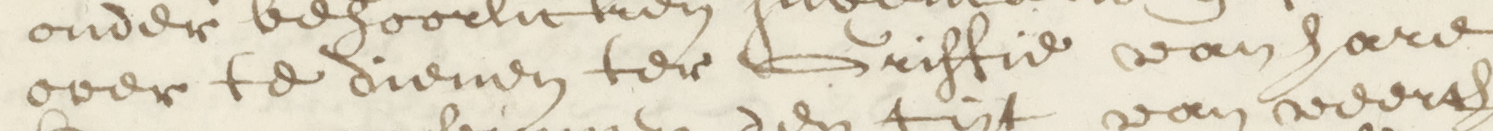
over te dienen ter Griffie van hare
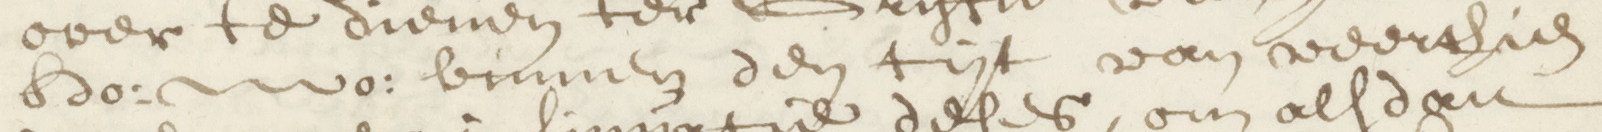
Ho:Mo: binnen den tijt van veerthien
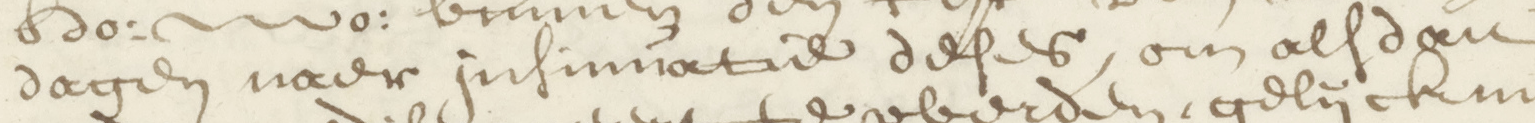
dagen naer insinuatie deses, om alsdan
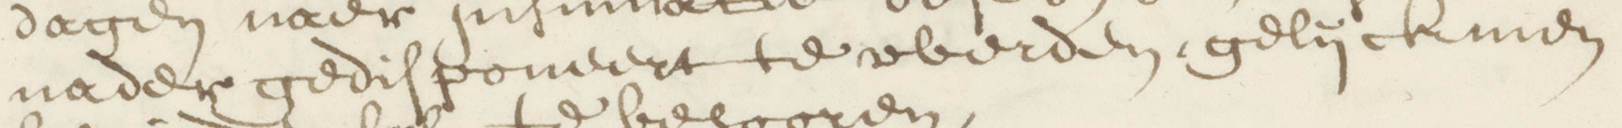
nader gedisponeert te werden, gelijck men
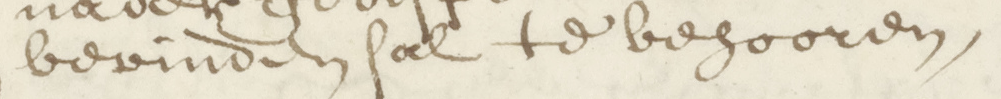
bevinden sal te behooren.
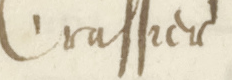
Crassier
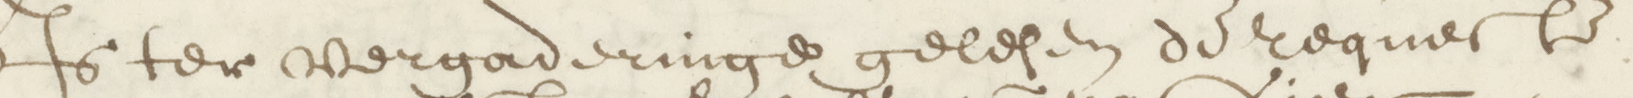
Is ter vergaderinge gelesen de requeste
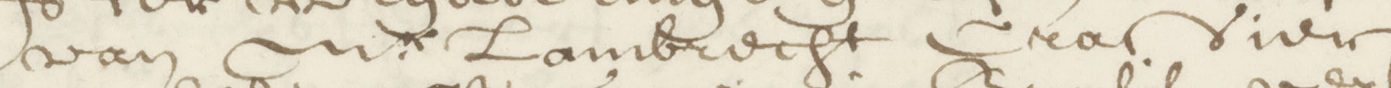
van Mr. Lambrecht Crassier
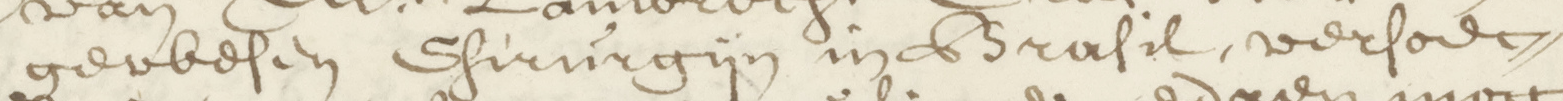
gewesen Chirurgijn in Brasil, versoec„
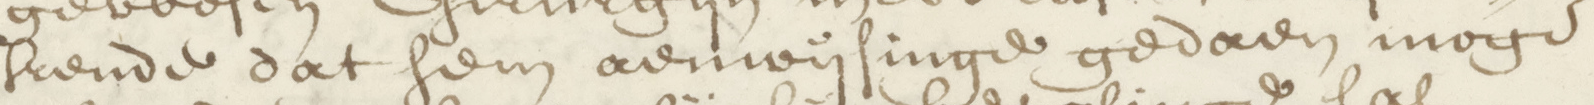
kende dat hem aenwijsinge gedaen moge
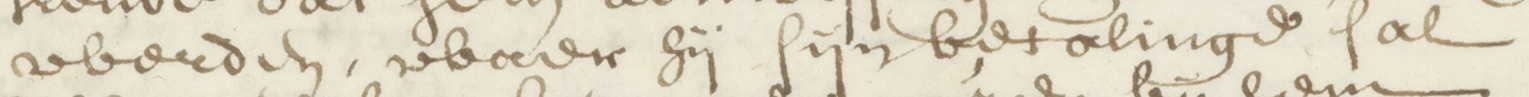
werden, waer hij sijn betalinge sal
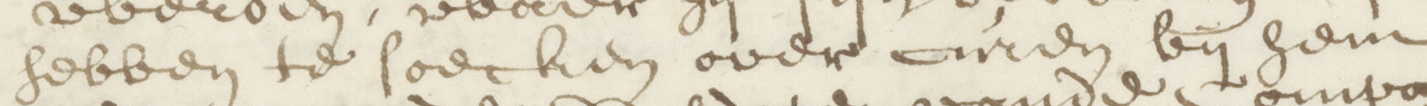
hebben te soecken over curen bij hem
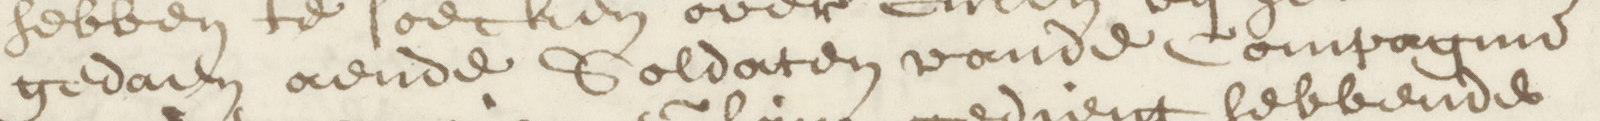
gedaen aende Soldaten vande Compagnie
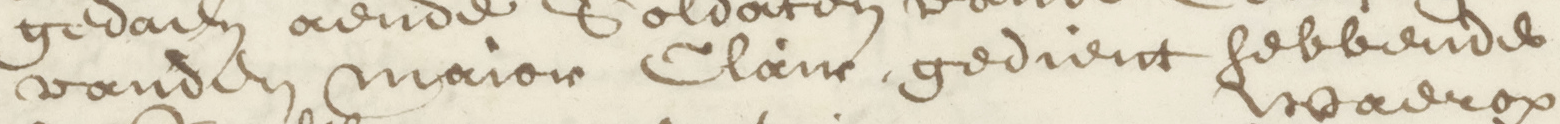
vanden maior Clair, gedient hebbende
